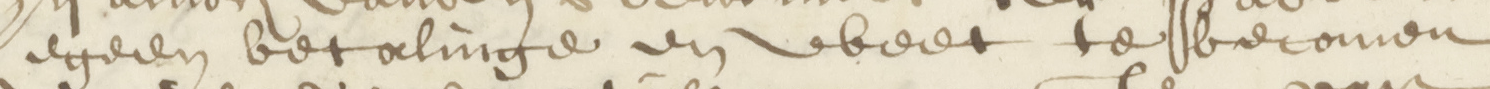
egeen betalinge en weet te becomen
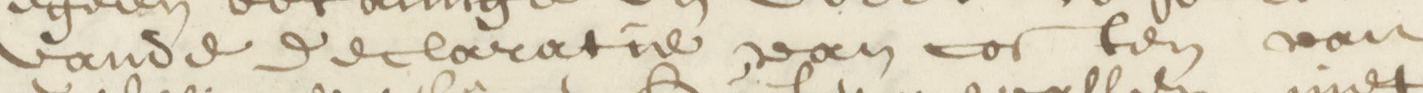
vande declaratie van costen van
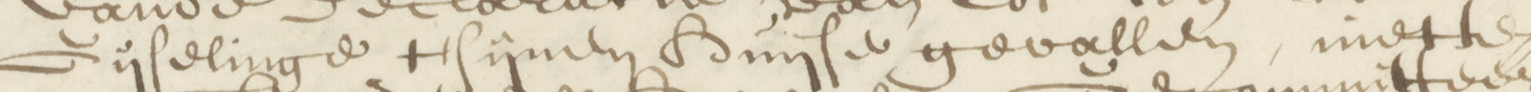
Gijselinge t‛sijnen Huijse gevallen, niette„
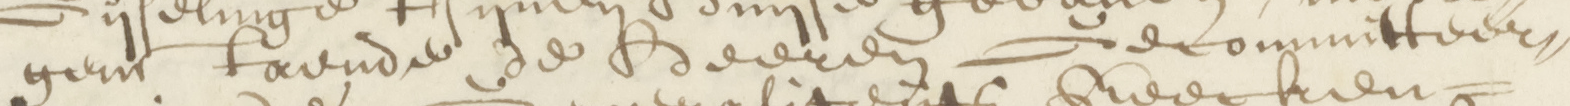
genstaende de Heeren Gecommitteer„
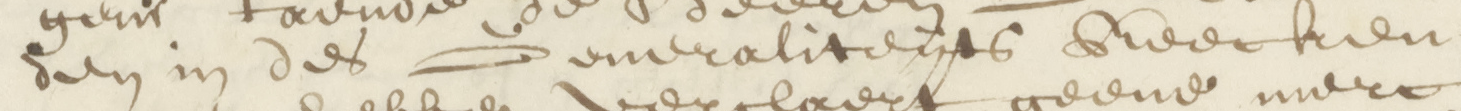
den in des Generaliteijts Reecken=
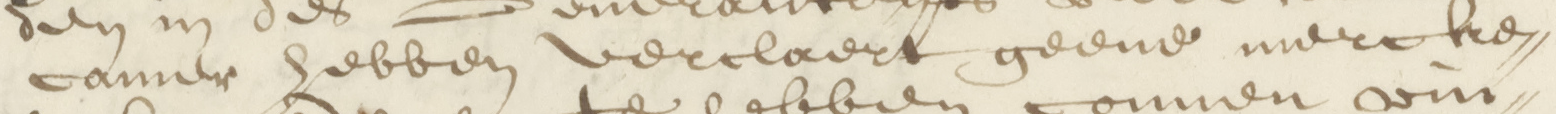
camer hebben verclaert geene mercke„
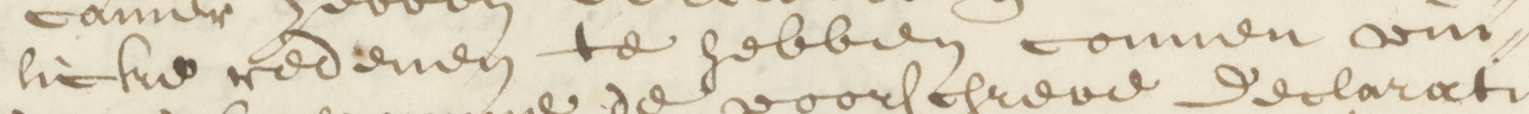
licke redenen te hebben connen vin„
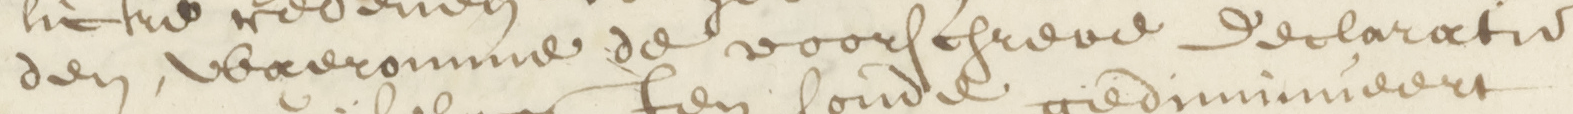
den, waeromme de voorschreve declaratie
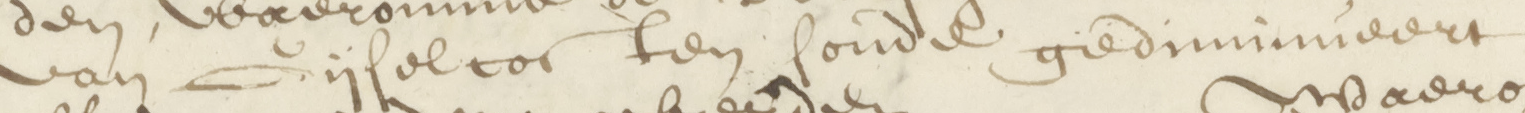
van Gijselcosten soude gediminueert
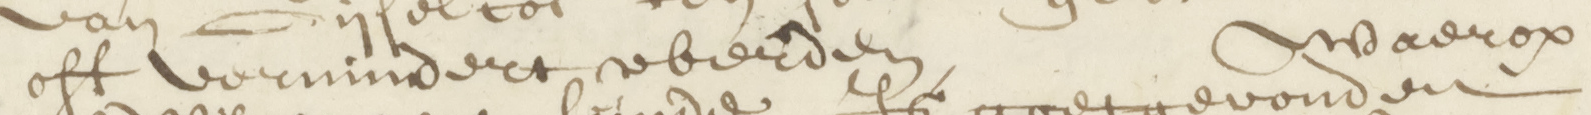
off vermindert werden, Waerop
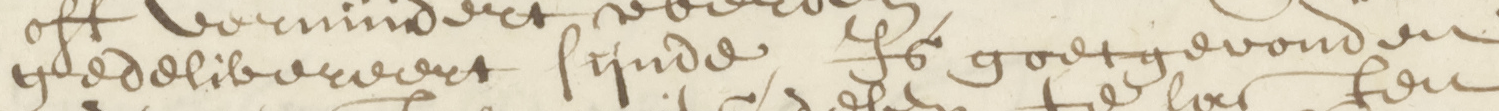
gedelibereert sijnde, Is goetgevonden
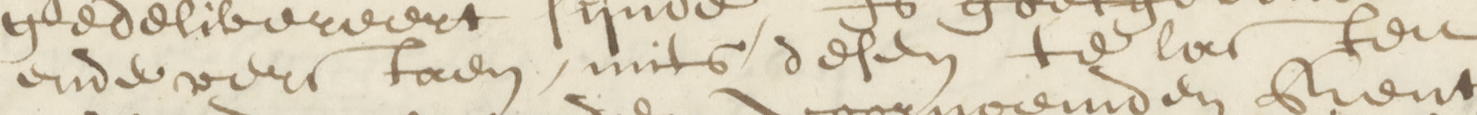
ende verstaen, mits desen te laten
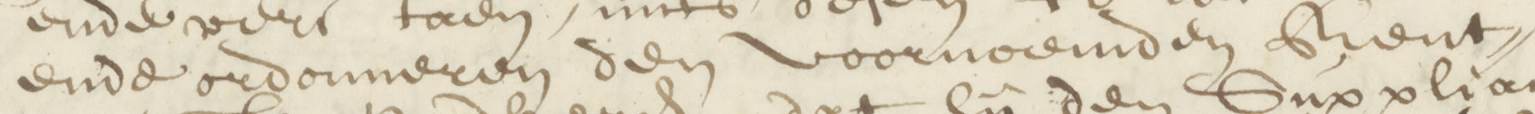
ende ordonneren den voornoemden Rent„
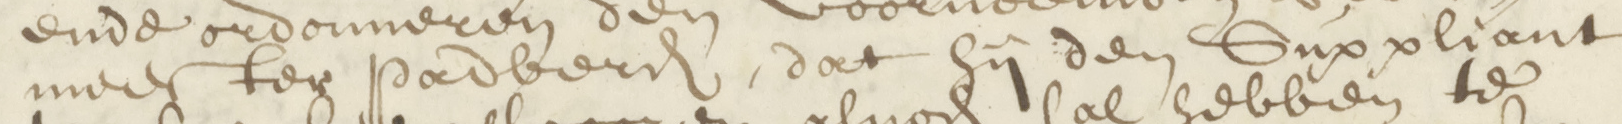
meester Padberch, dat hij den Suppliant
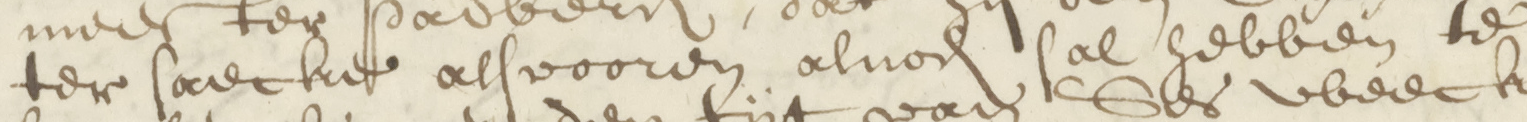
ter saecke alsvooren alnoch sal hebben te
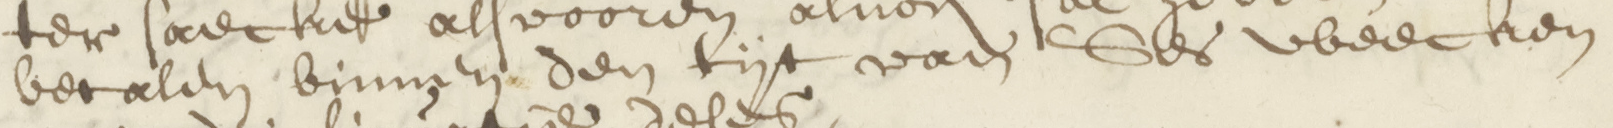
betalen binnen den tijt van Ses weecken
